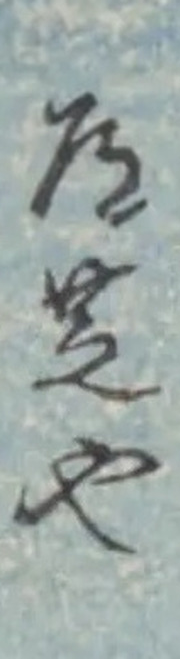道芝や
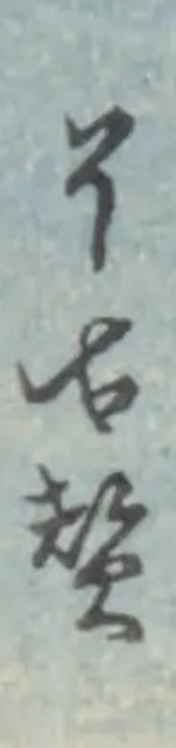了古賛
